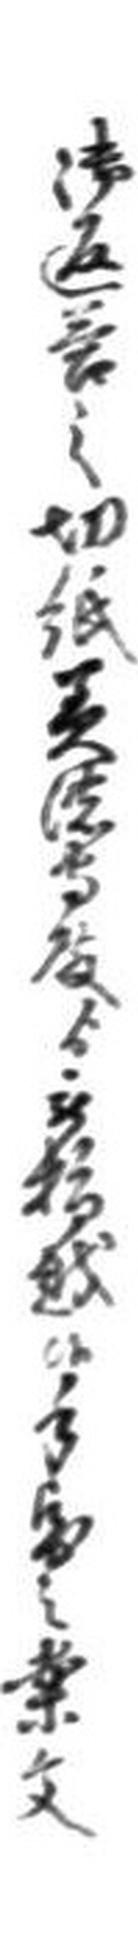御返答之切紙美濃守殿ゟ被指越候手紙之案文
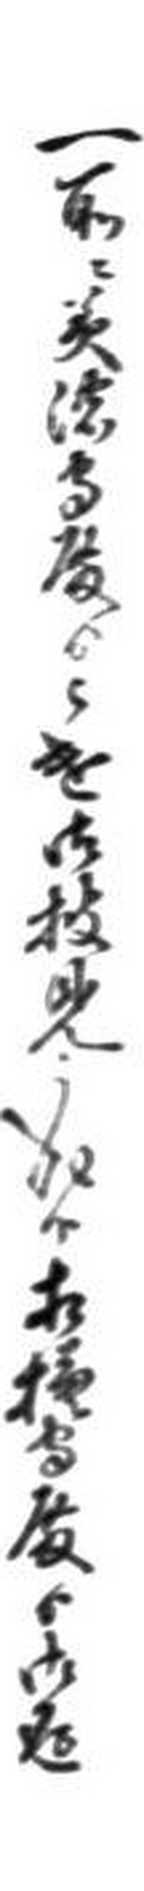一所ニ美濃守殿ゟ被遣御披見被成候相模守殿ゟ御返

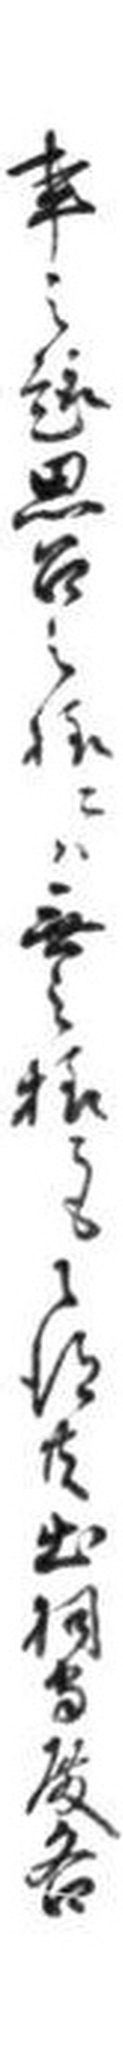事之趣思召之様ニハ無之様ニも候得共出羽守殿各
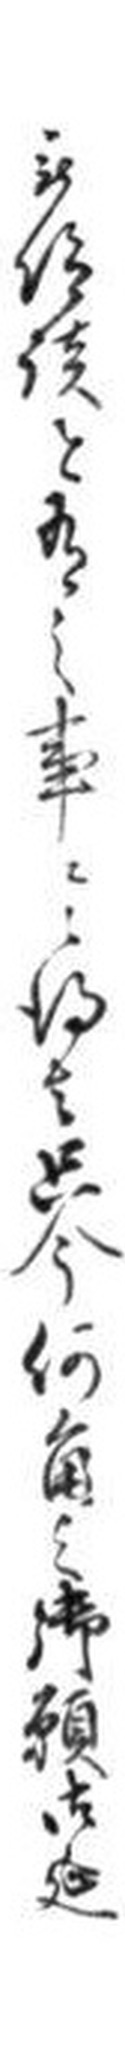被仰談と有之事ニ候得者只今何角之御願御延
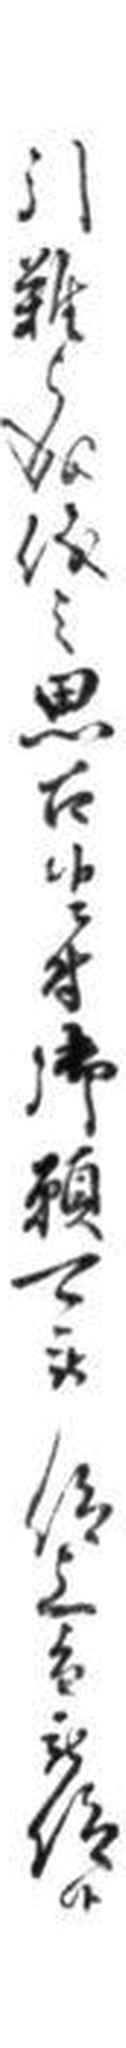引難被成儀与思召候ニ付御願可被仰上旨被仰候
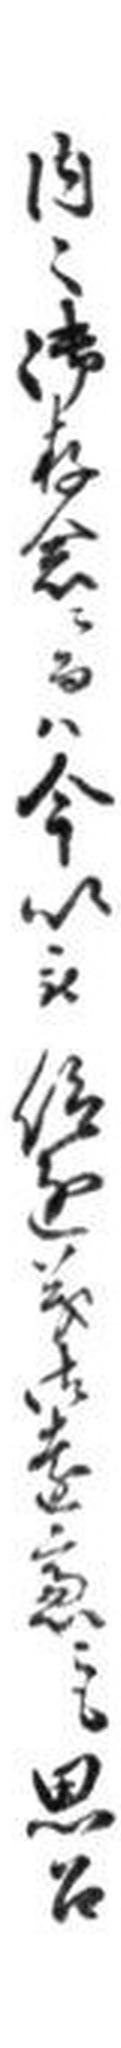内々御存念ニ而ハ今以被仰進義御遠慮ニも思召
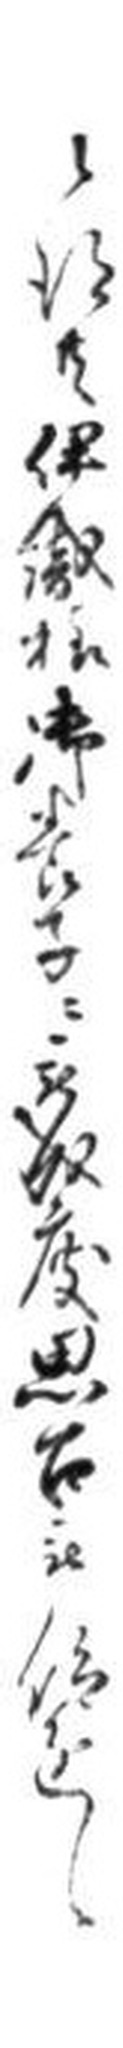候得共伊織様御養子ニ被成度思召被仰進候
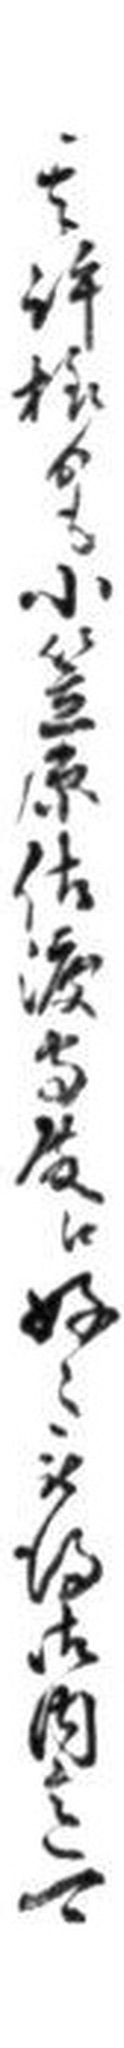其許様ゟも小笠原佐渡守殿江好々被得御内意可
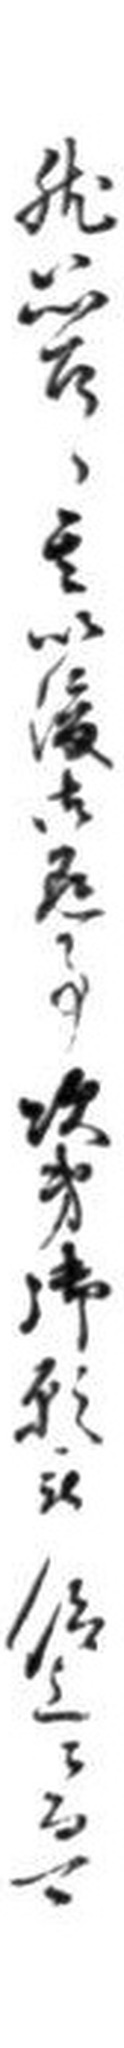然思召候其以後御返事次第御願被仰上候而可
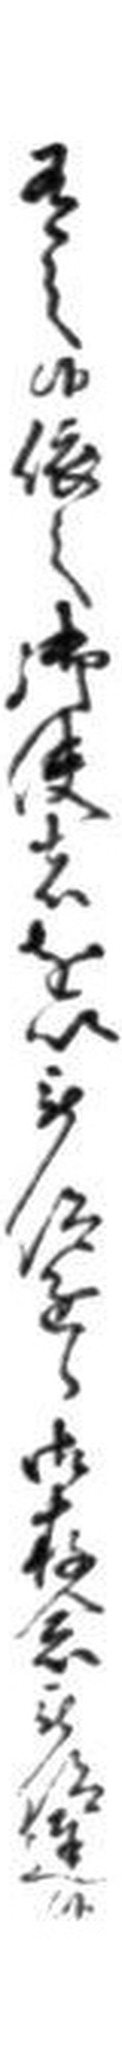有之候依之御使者を以被仰進候御存念被仰達候
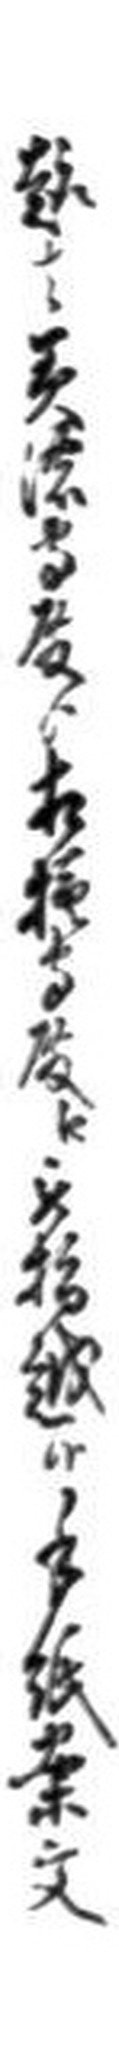趣者美濃守殿ゟ相模守殿江被指越候手紙案文
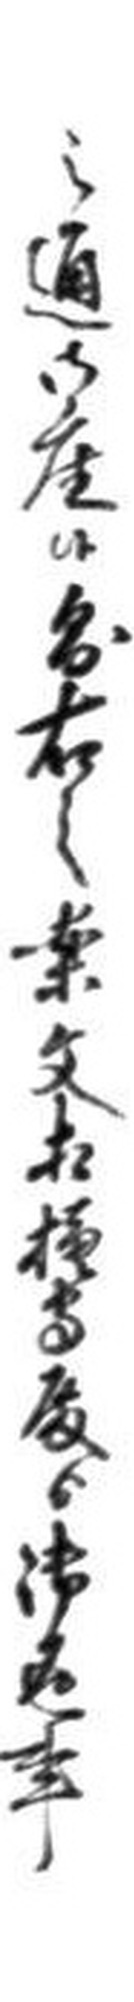之通御座候則右之案文相模守殿ゟ御返事
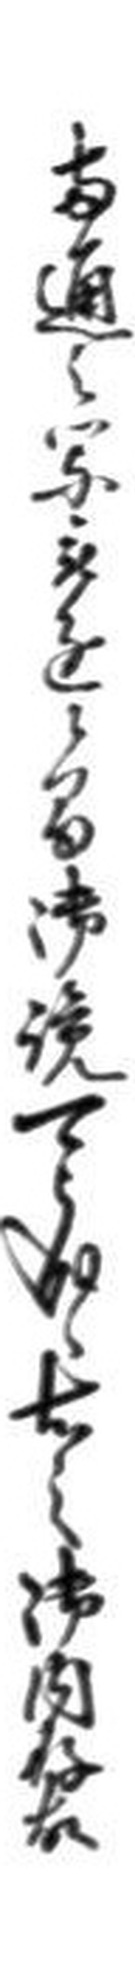両通之写被進候間御覧可被成候右之御内存故
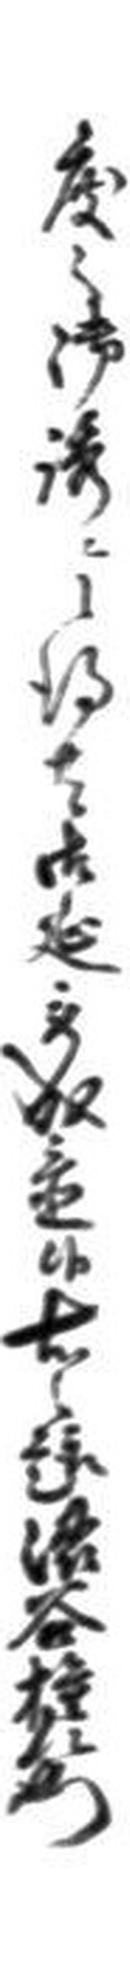度々御誘ニ候得者御延被成置候右之趣渋谷権左衛門
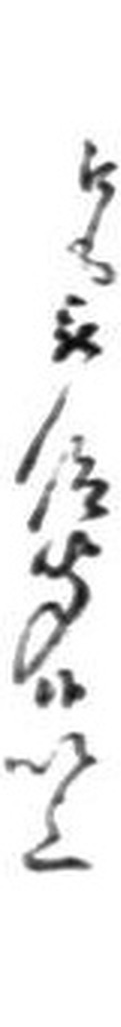江も被仰聞候以上
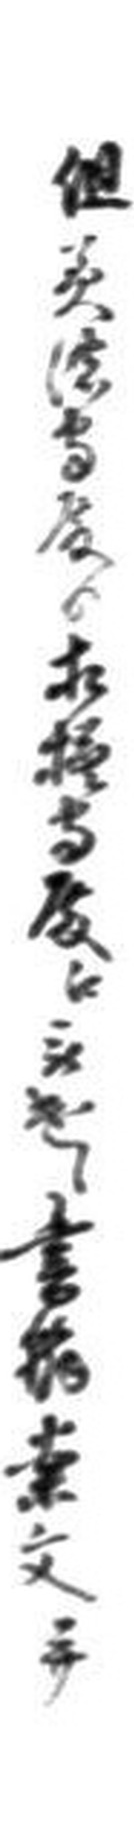但美濃守殿ゟ相模守殿江被遣候書翰案文幷
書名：家譜 二十一 吉品公 従元禄十三年到同十四年
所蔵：福井県文書館 Fukui Prefectural Archives
